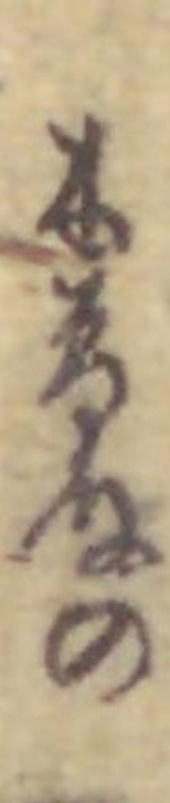木曽殿の
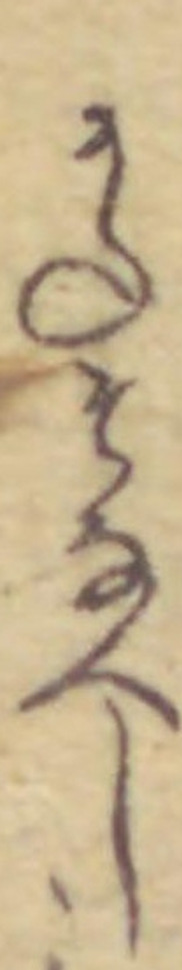かねそなへし
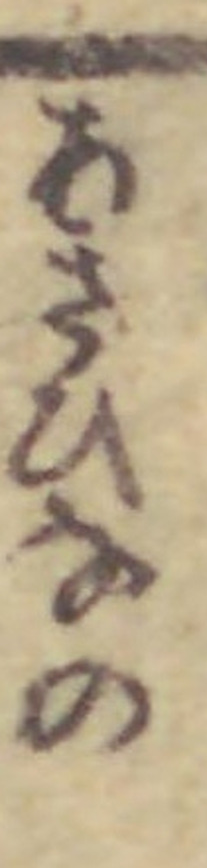あさひなの
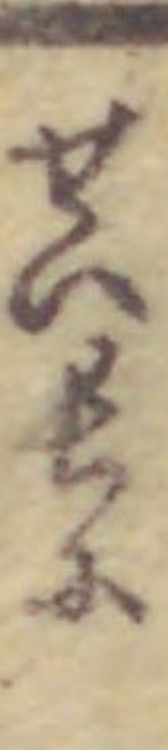せい長に
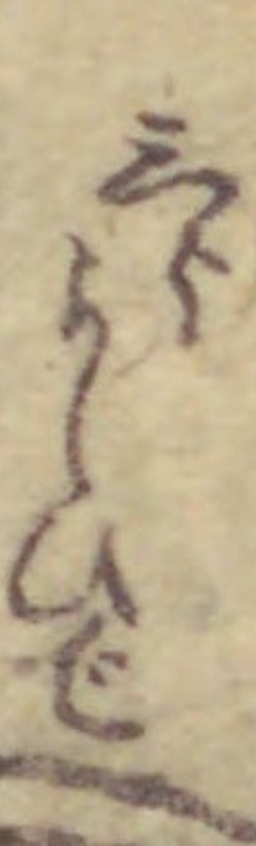よしひで
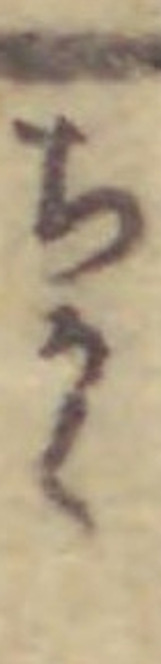ちから
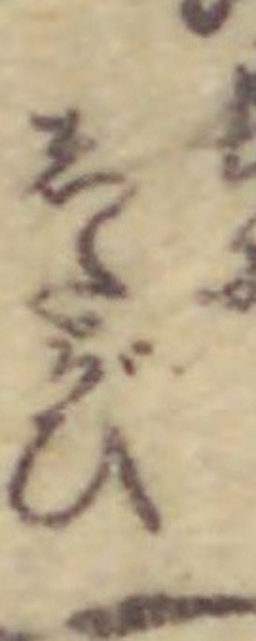したがひ
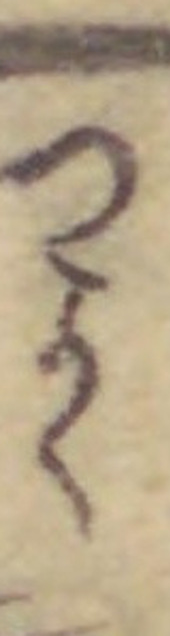つよく

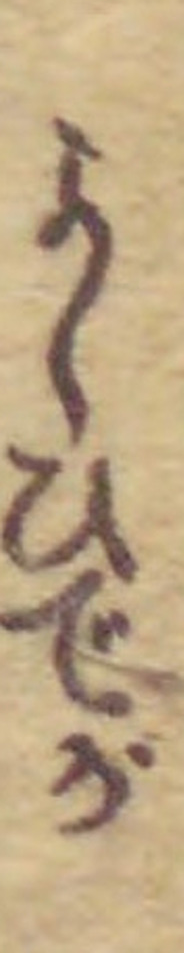よしひでか
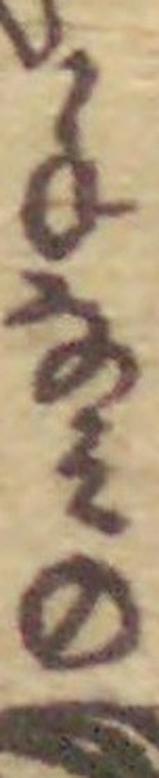手なみの
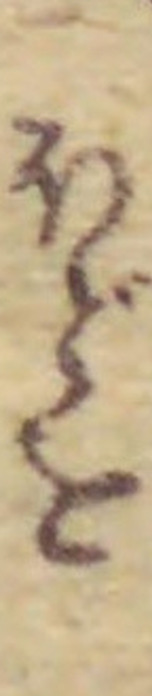ほどを
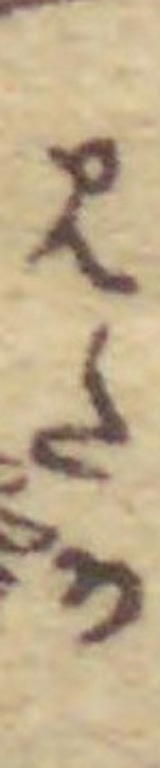見たか
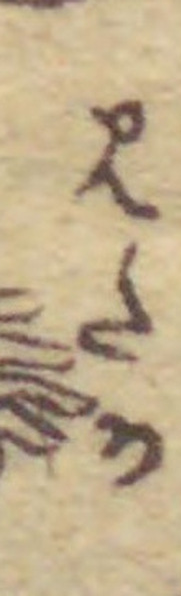見たか
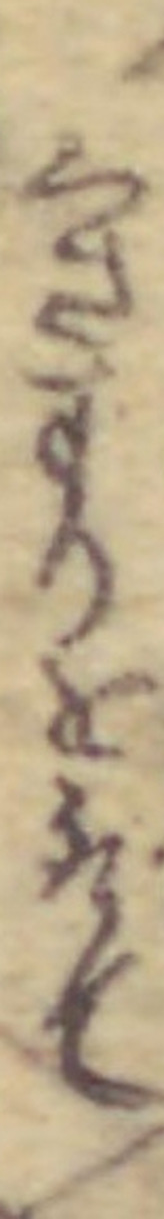くさすりを取りて
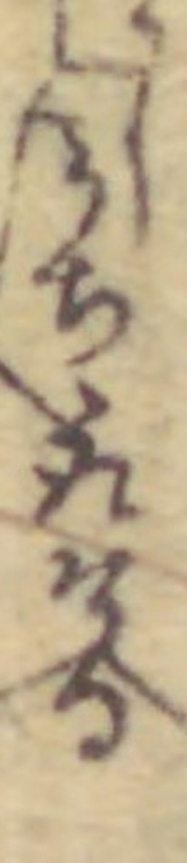うち取ける
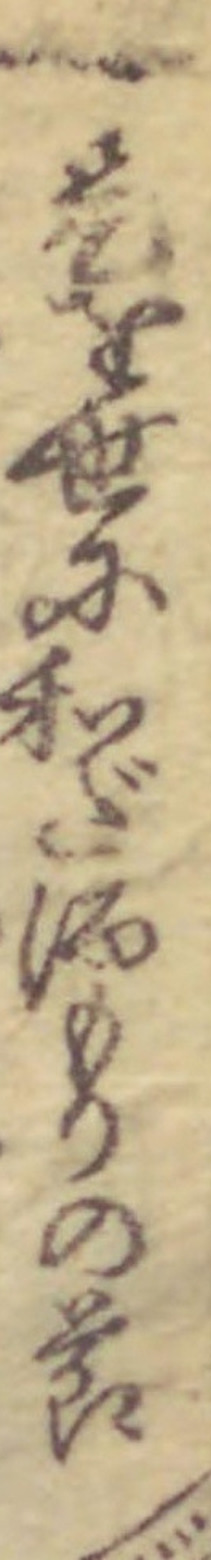是を世に和だ酒もりの節
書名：朝比奈草摺実記 2巻
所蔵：国立国会図書館 National Diet Library, JAPAN
